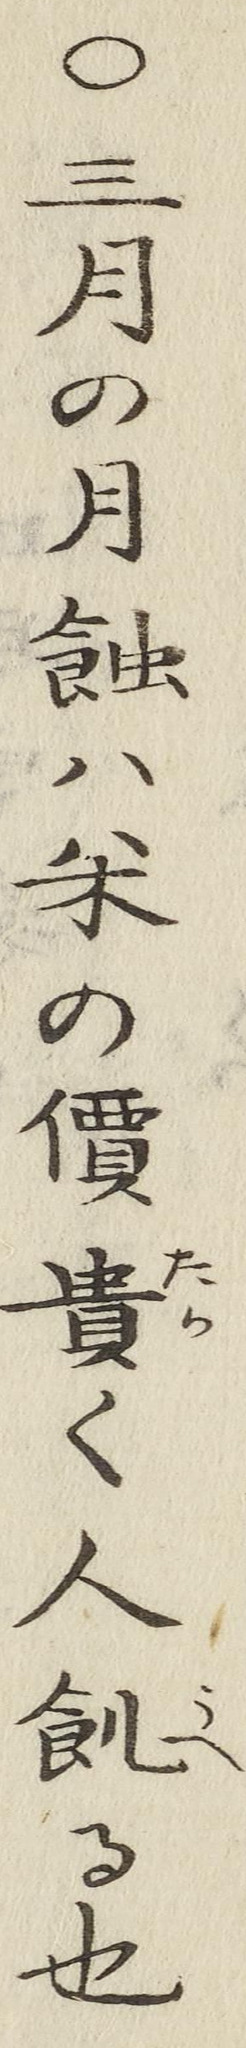○三月の月蝕は米の価貴く人飢る也
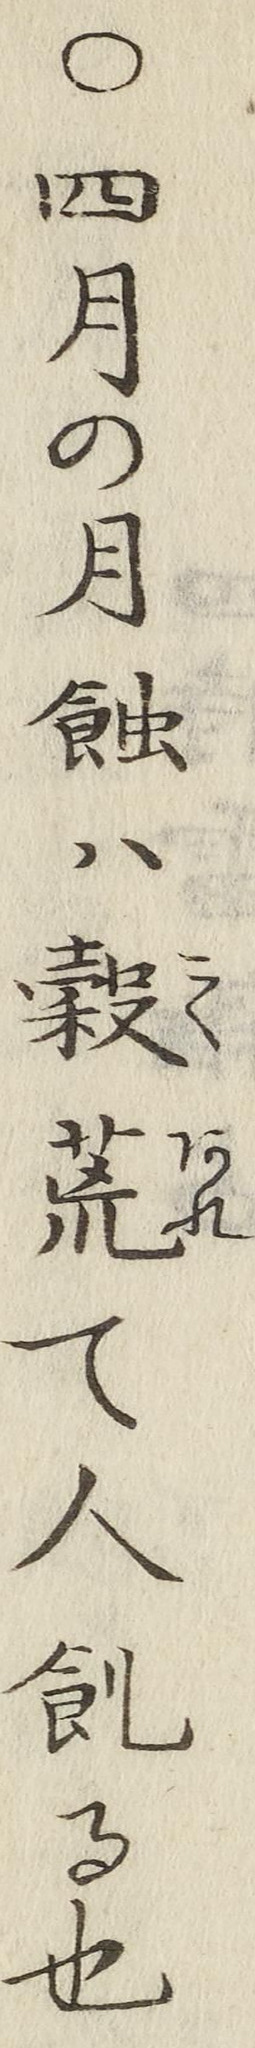○四月の月蝕は穀荒て人飢る也
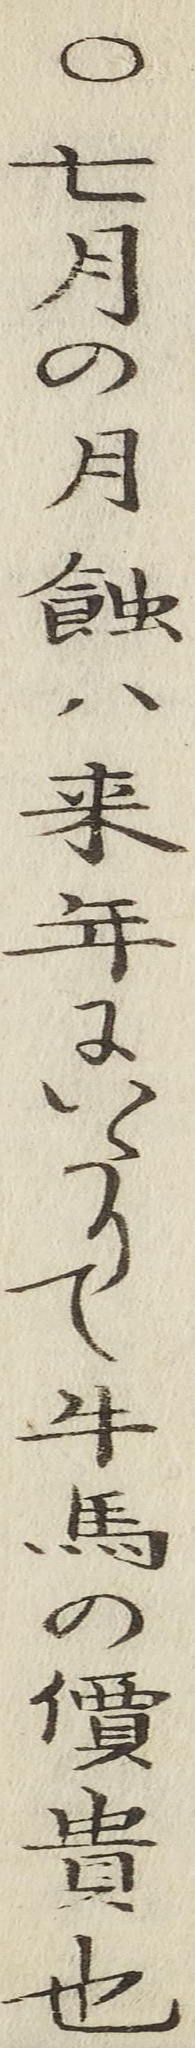○七月の月蝕は来年にいたりて牛馬の価貴也
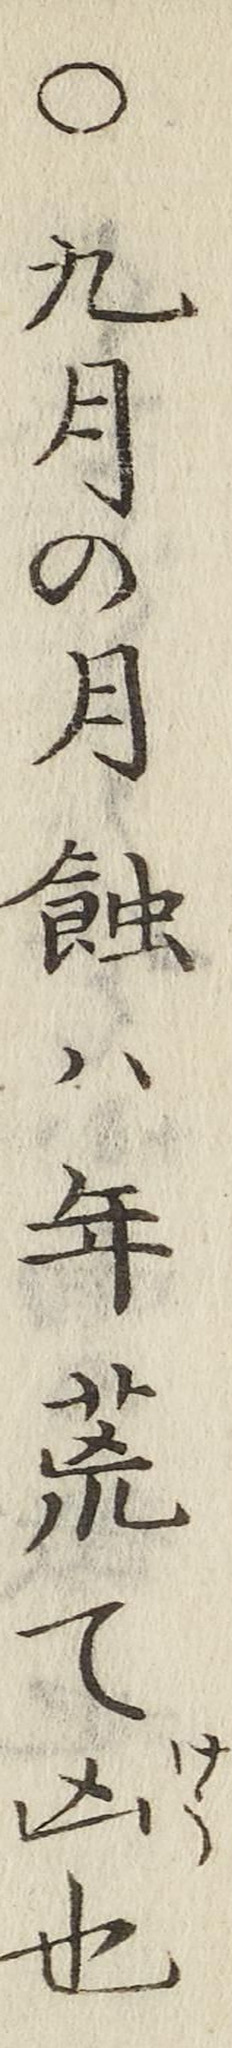○九月の月蝕は年荒て凶也
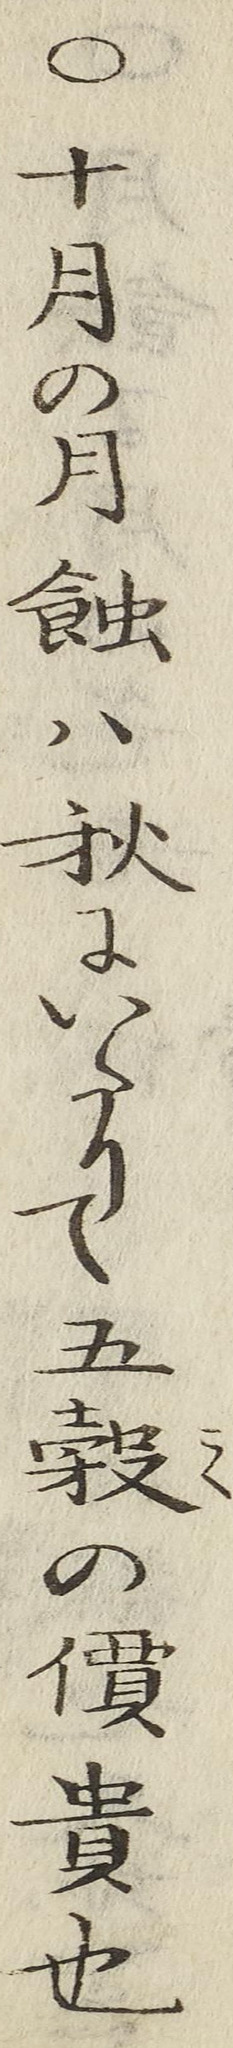○十月の月蝕は秋にいたりて五穀の価貴也
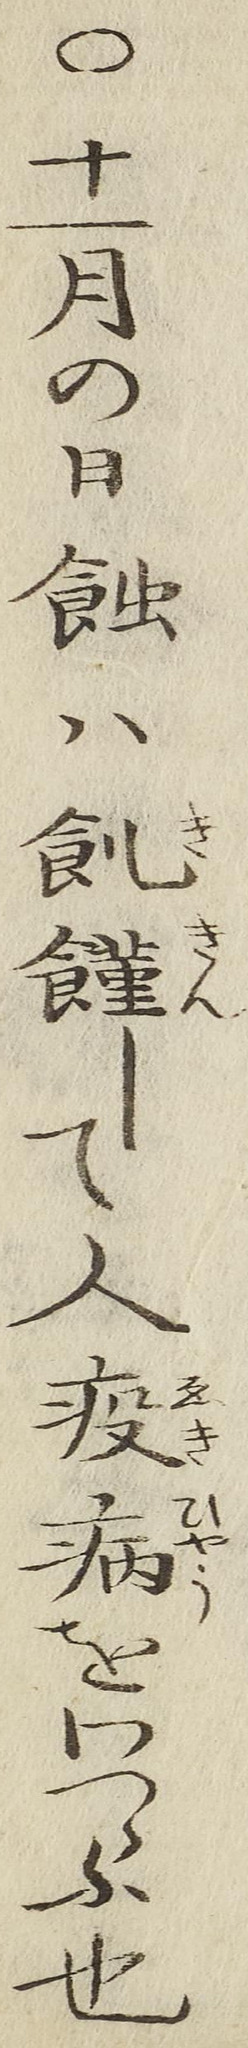○十一月の日蝕は飢饉して人疫病をわつらふ也

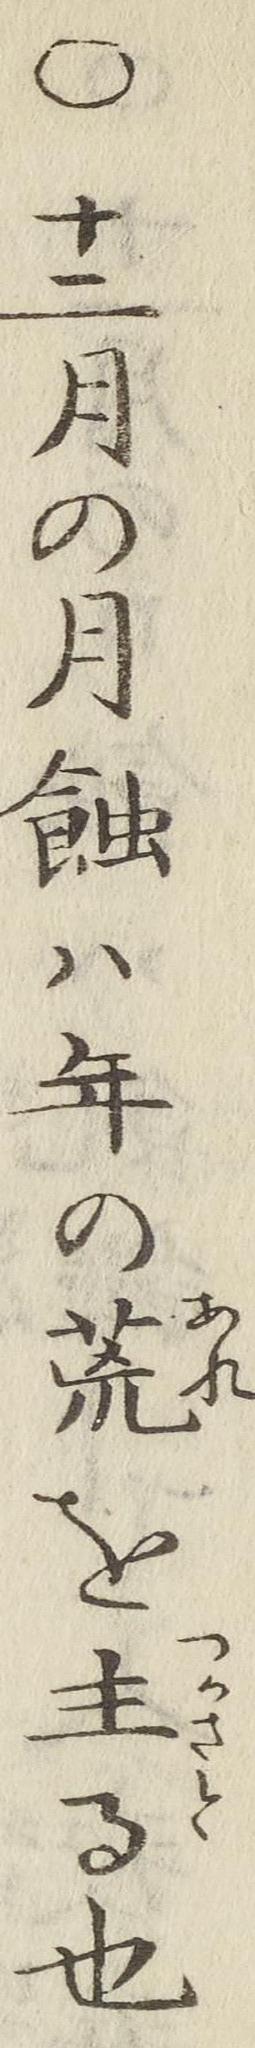○十二月の月蝕は年の荒を主る也
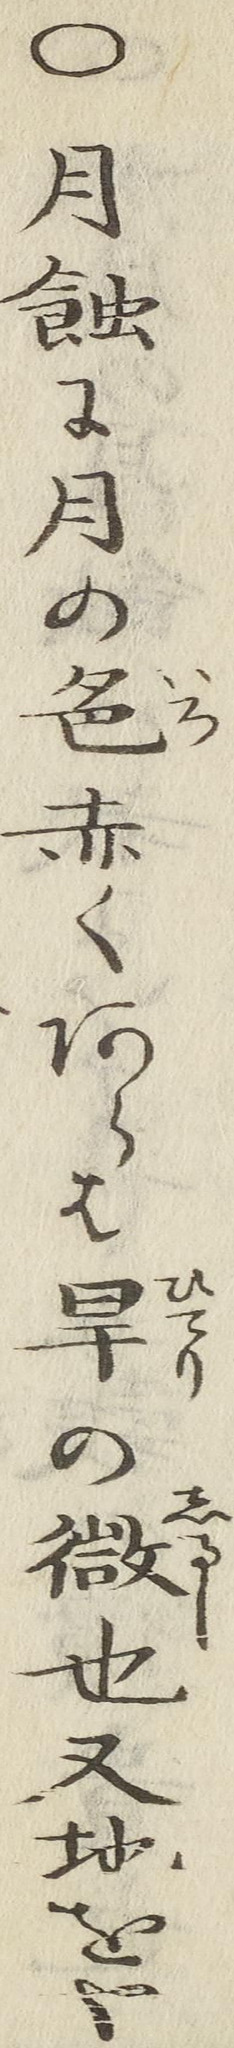○月蝕に月の色赤くあらは旱の徴也又地をや
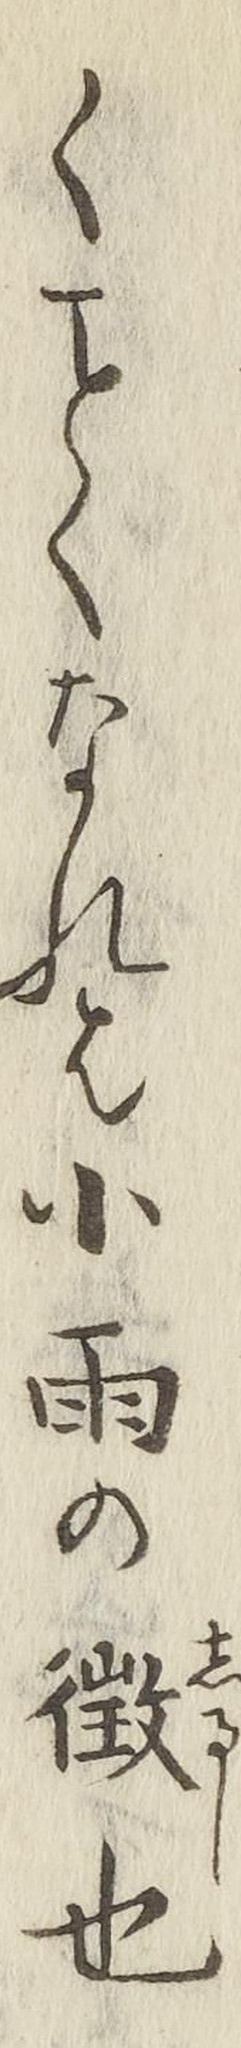くことくなれは小雨の徴也
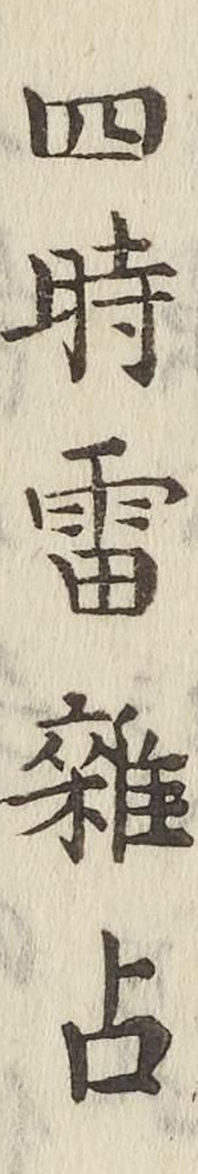四時雷雑占
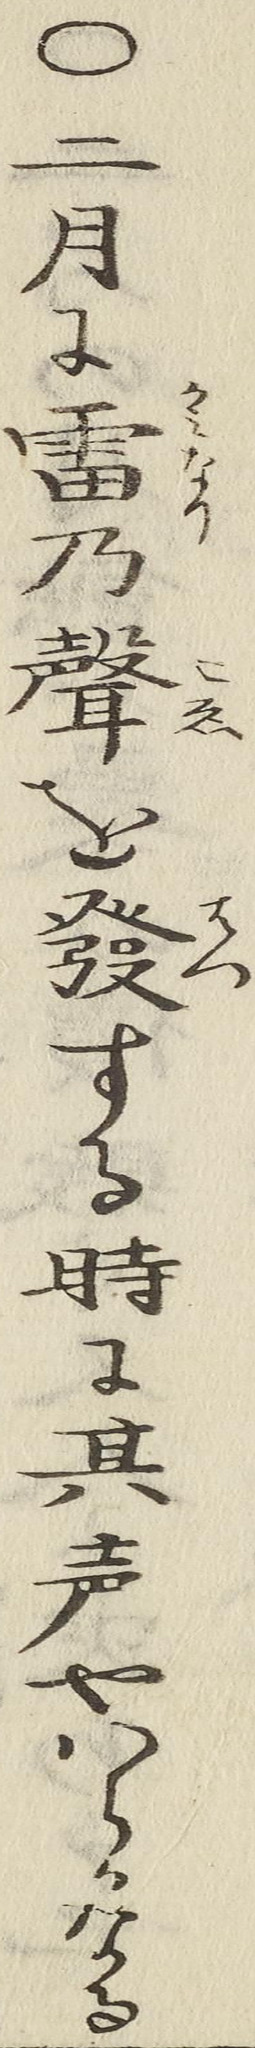○二月に雷の声を発する時に其声やはらかなる
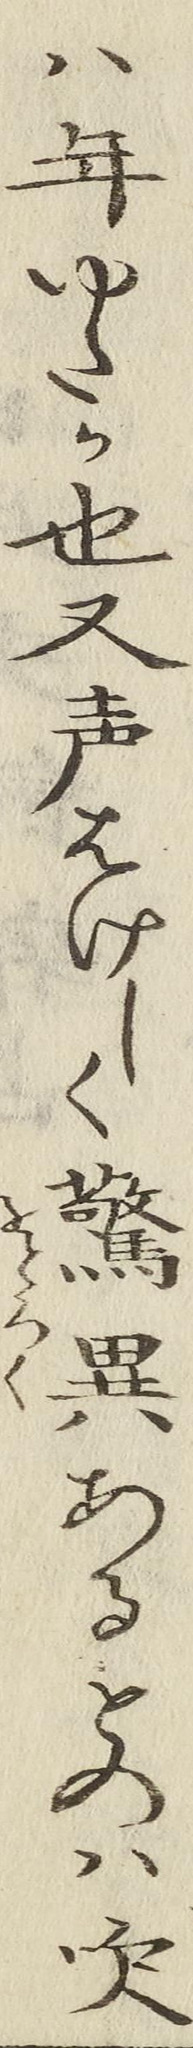は年ゆたか也又声はけしく驚異あるものは災
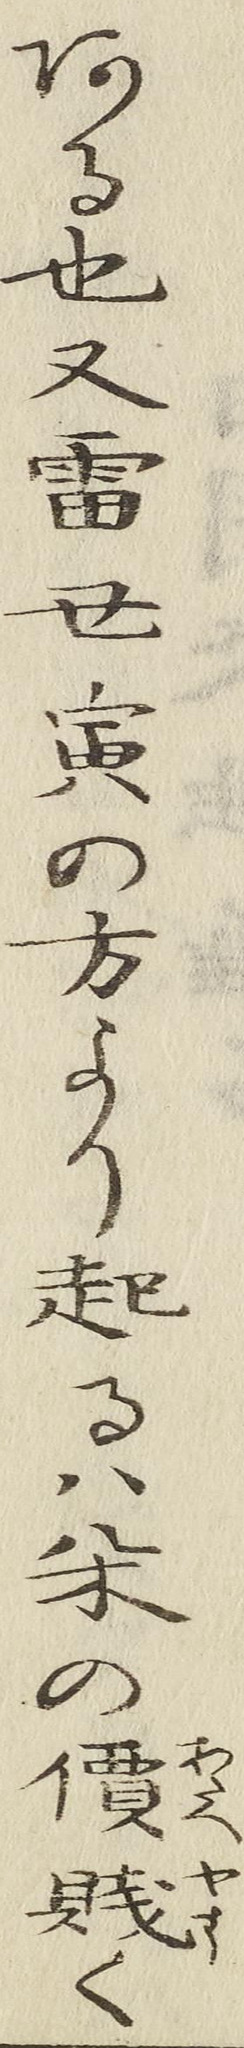ある也又雷丑寅の方より起るは米の価賤く
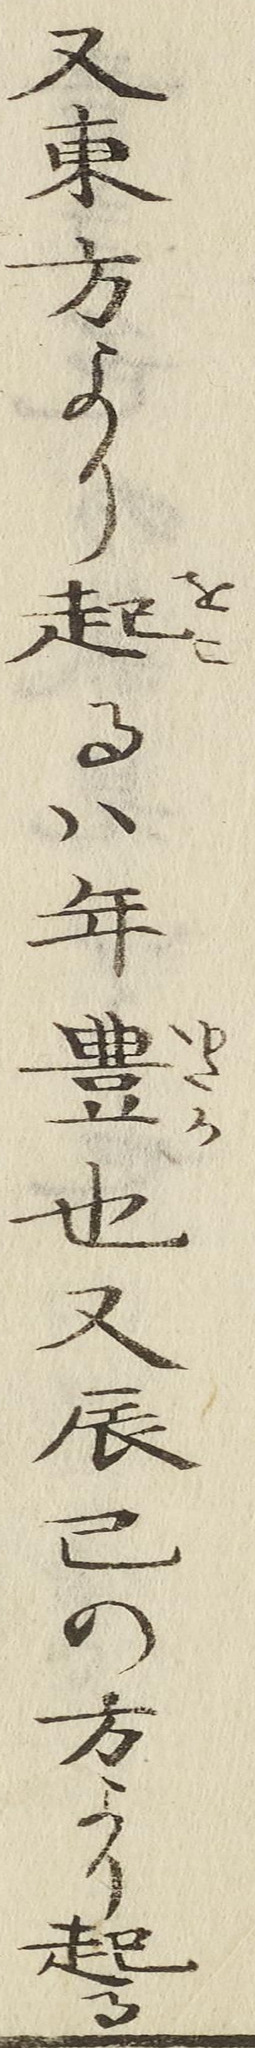又東方より起るは年豊也又辰巳の方より起る
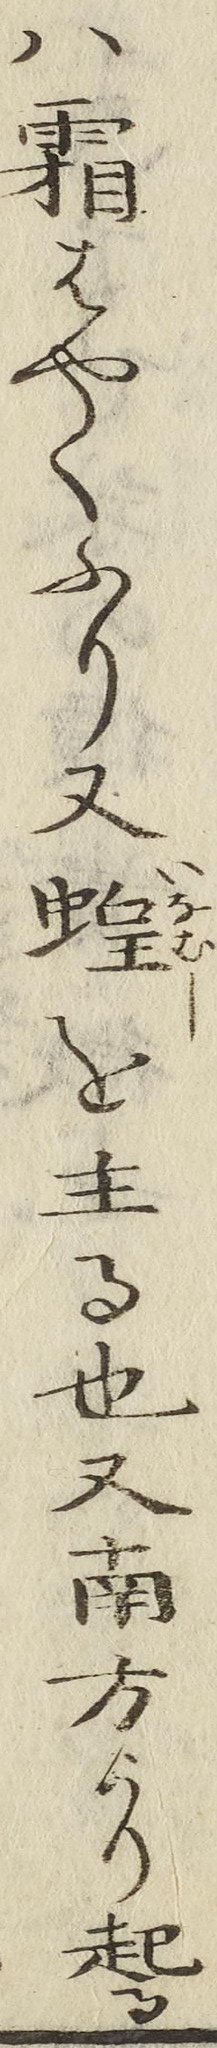は霜はやくふり又蝗を主る也又南方より起る
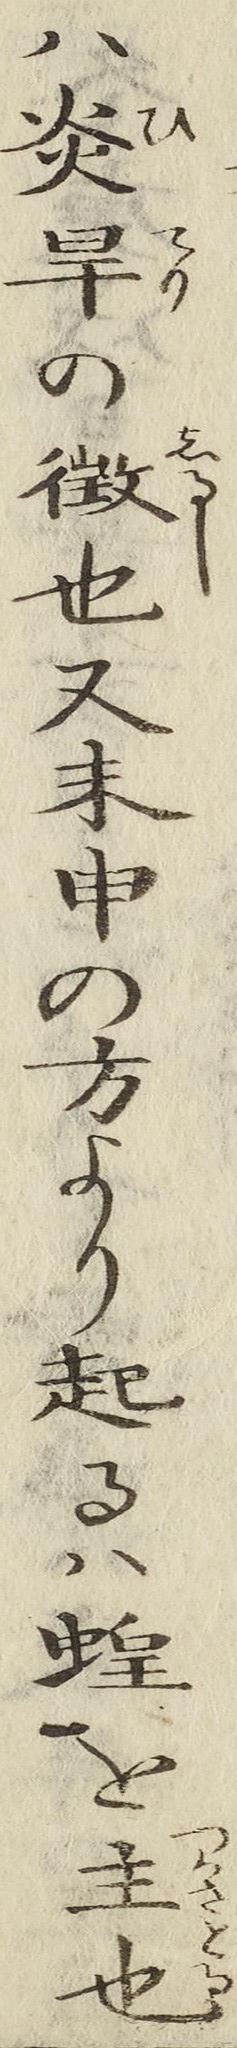は炎旱の徴也又未申の方より起るは蝗を主也
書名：天時占候　二
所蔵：東京大学地震研究所図書室 Earthquake Research Institute Library, The University of Tokyo, JAPAN
